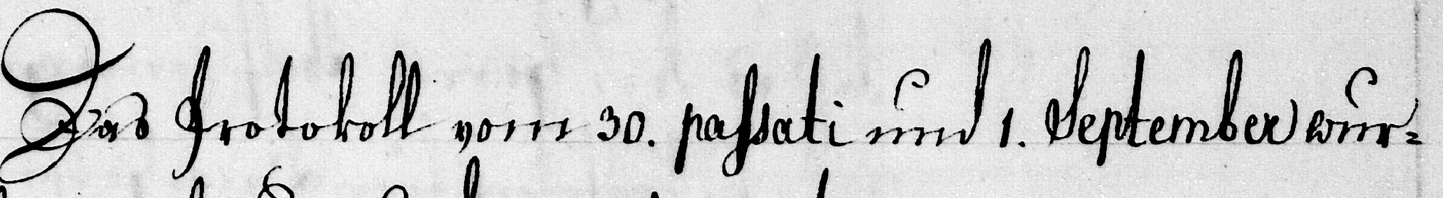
Das Protokoll vom 30. passati und 1. September wur¬
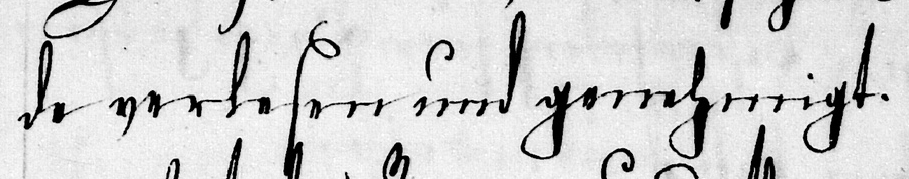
de verlesen und genehmigt.
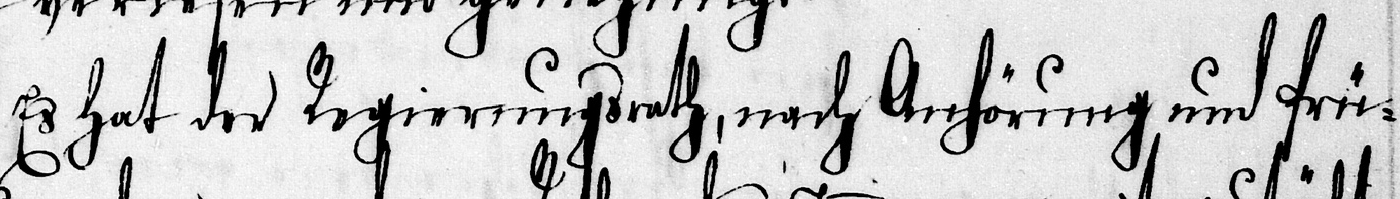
Es hat der Regierungsrath, nach Anhörung und Prü¬
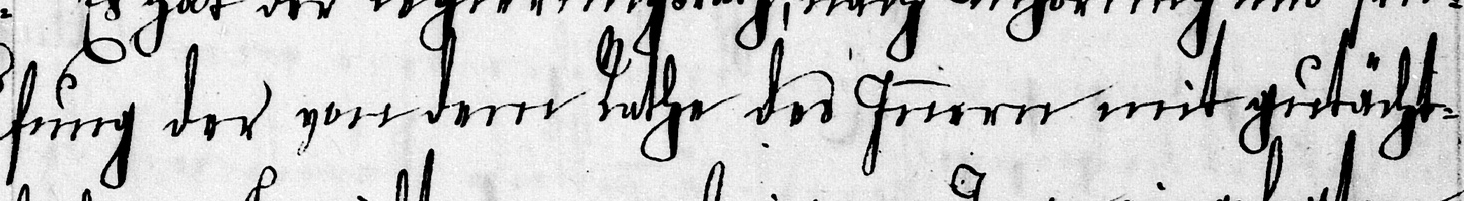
fung der von dem Rathe des Innern mit gutächt¬
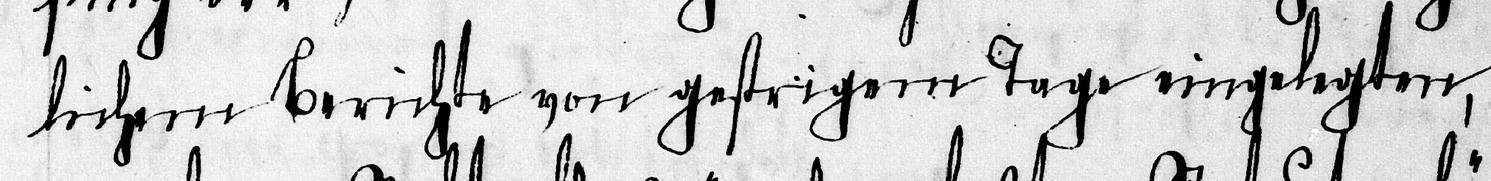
lichem Berichte von gestrigem Tage eingelegten,
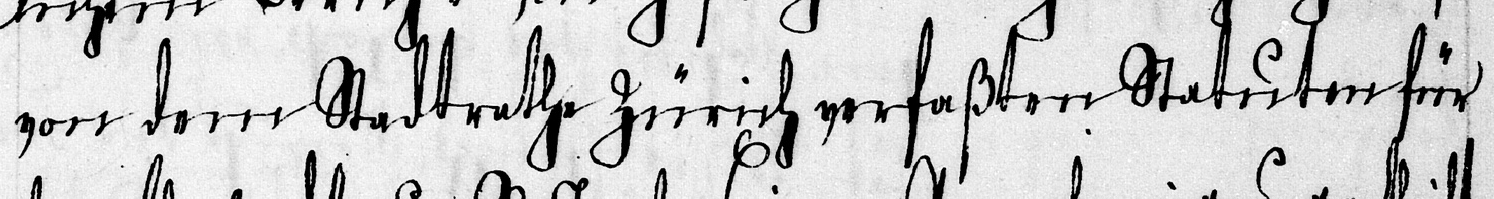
von dem Stadtrathe Zürich verfaßten Statuten für
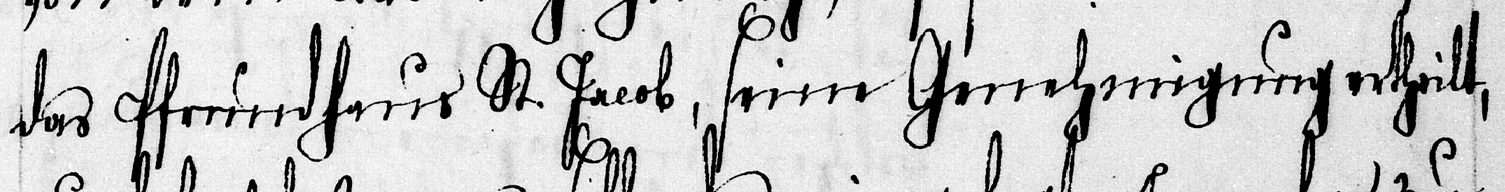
das Pfrundhaus St. Jacob, seine Genehmigung ertheilt,
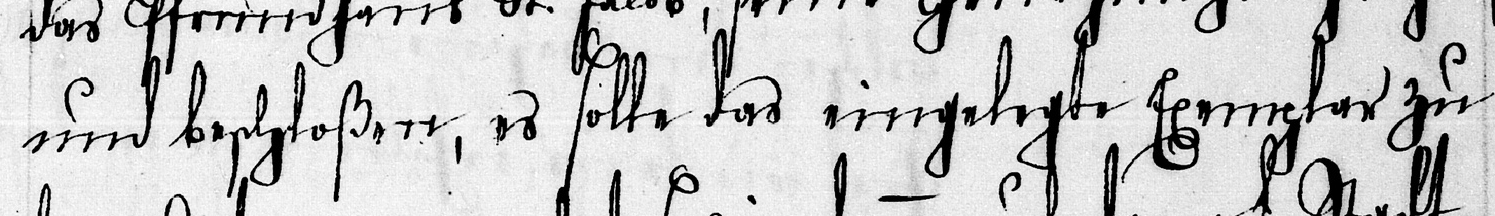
und beschloßen, es solle das eingelegte Exemplar zu
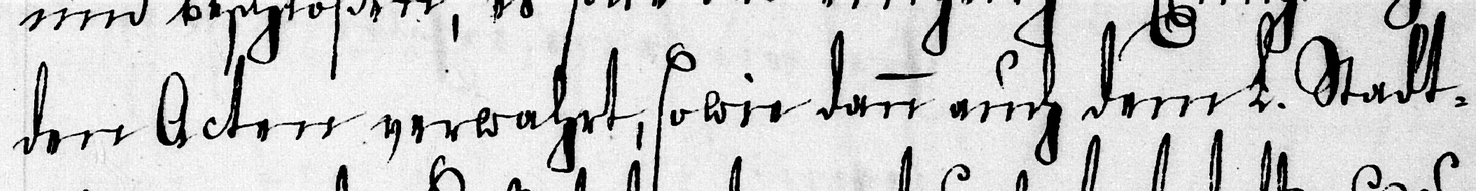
den Acten verwahrt, sowie dann auch dem L. Stadt¬
